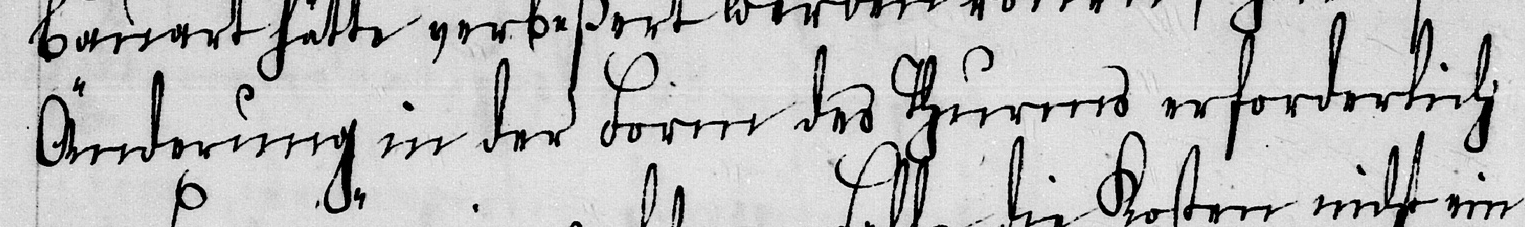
Änderung in der Form des Thurms erforderlich
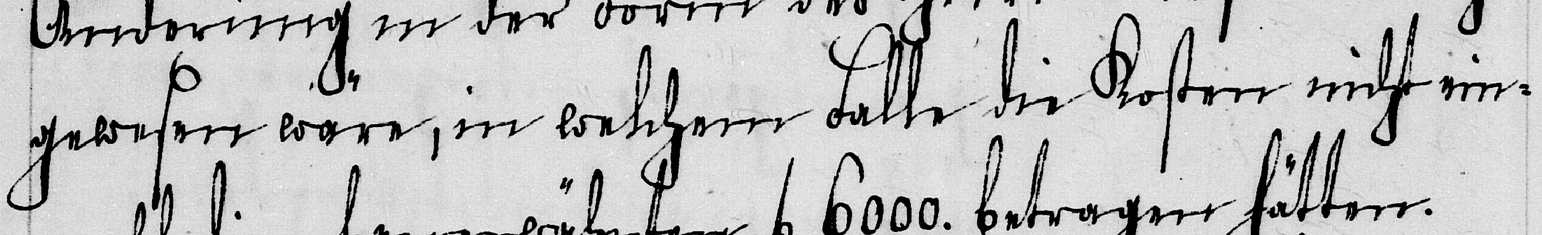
gewesen wäre, in welchem Falle die Kosten nicht ein¬
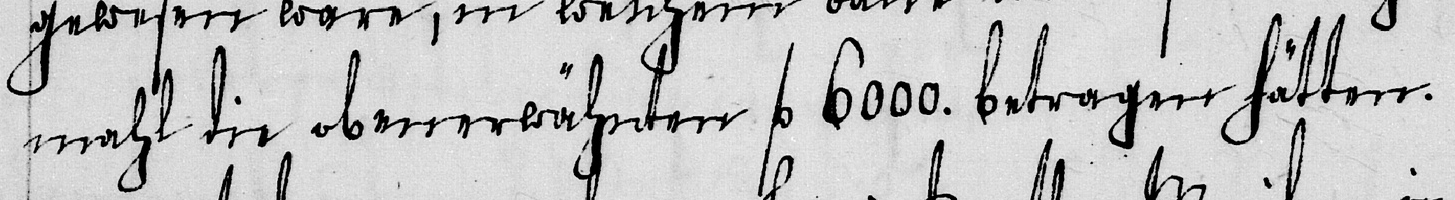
mahl die obenerwähnten fl. 6000 betragen hätten.
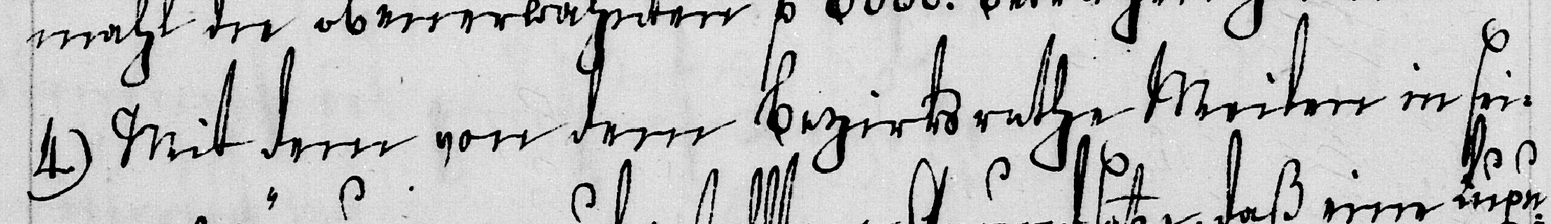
4.) Mit dem von dem Bezirksrathe Meilen in sei¬
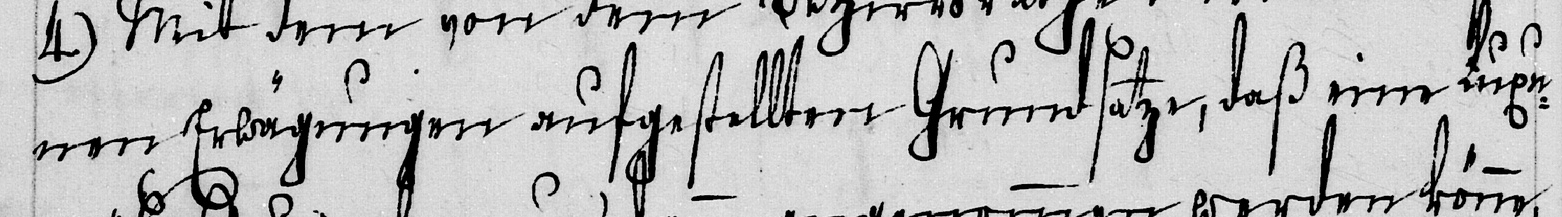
nen Erwägungen aufgestellten Grundsatze, daß eine Luxu¬
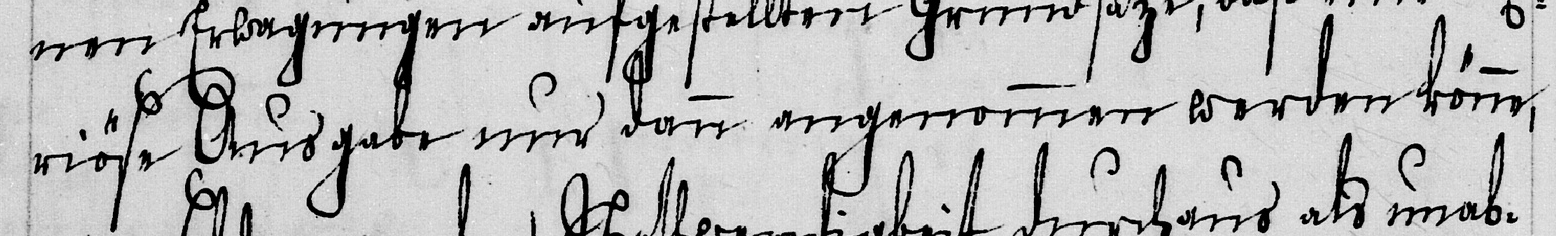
riöse Ausgabe nur dann angenommen werden könne,
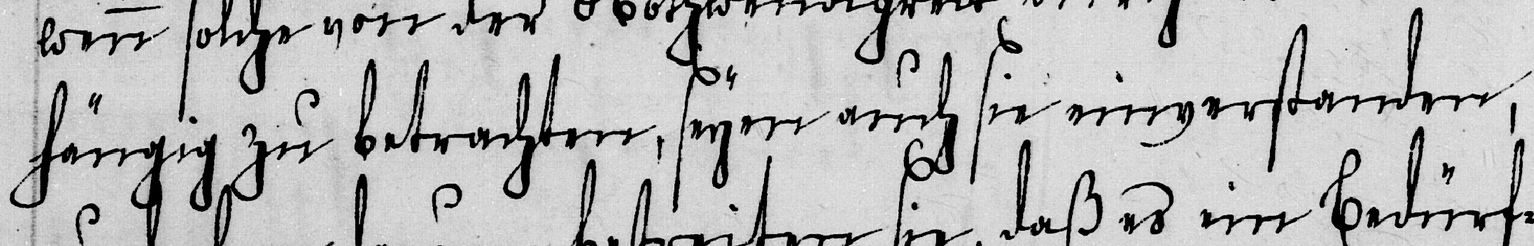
hängig zu betrachten, seyen auch sie einverstanden,
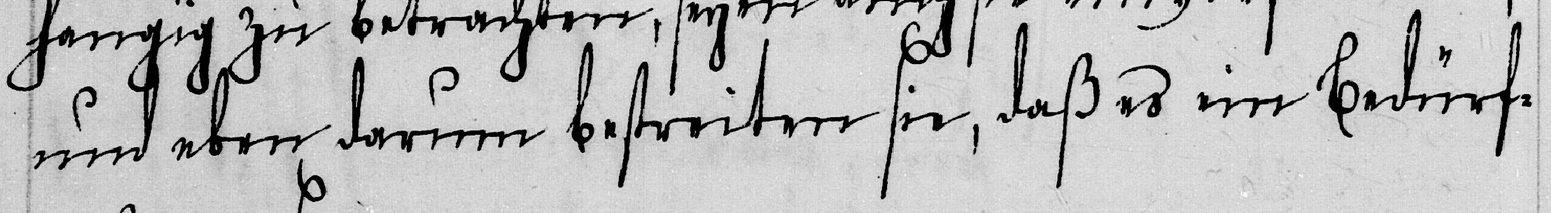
und eben darum bestreiten sie, daß es ein Bedürf¬
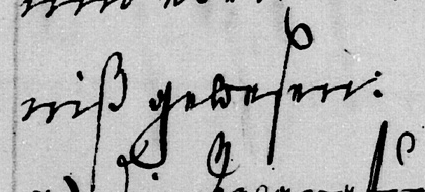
niß gewesen:
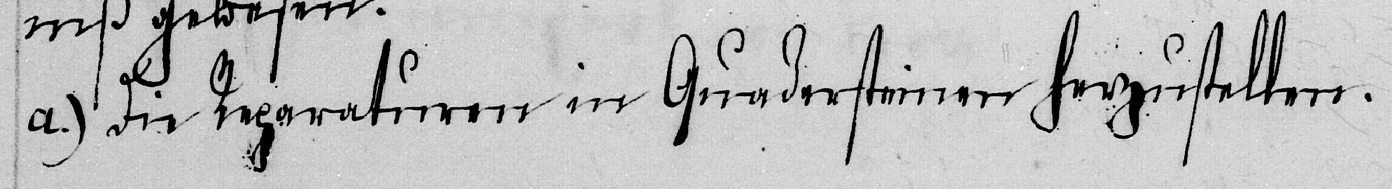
a.) Die Reparaturen in Quadersteinen herzustellen.
